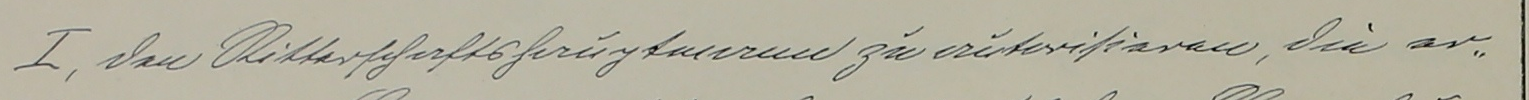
I. den Ritterschaftshauptmann zu autorisieren, die er-
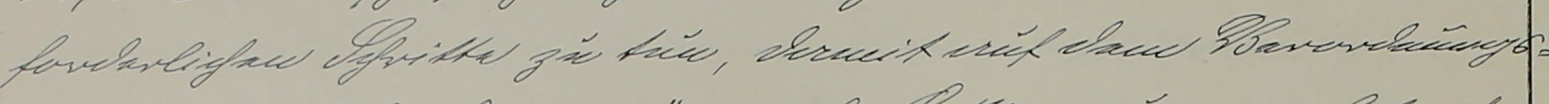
forderlichen Schritte zu tun, damit auf dem Verordnungs-
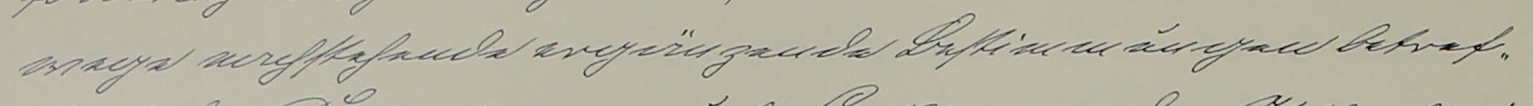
wege nachstehende ergänzende Bestimmungen betref-
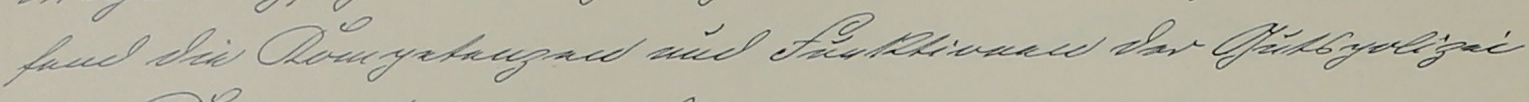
fend die Kompetenzen und Funktionen der Gutspolizei
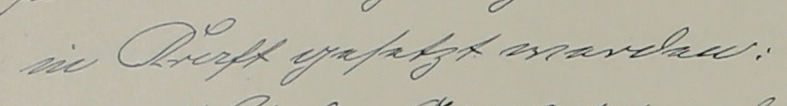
in Kraft gesetzt werden:
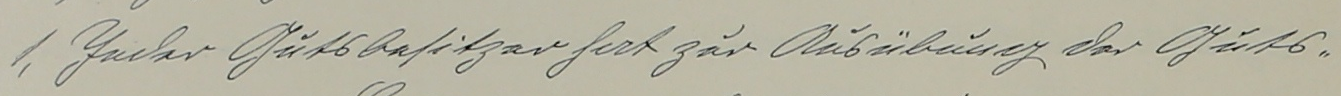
1. Jeder Gutsbesitzer hat zur Ausübung der Guts-
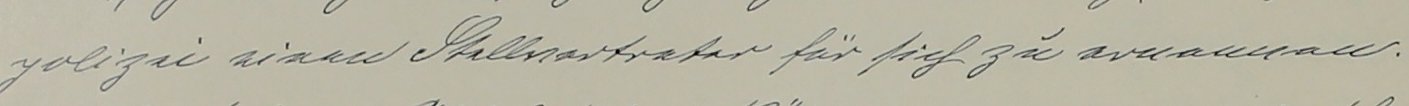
polizei einen Stellvertreter für sich zu ernennen.
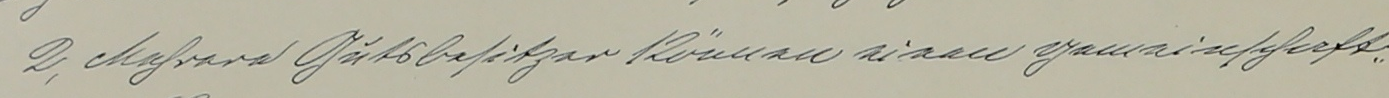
2. Mehrere Gutsbesitzer können einen gemeinschaft-
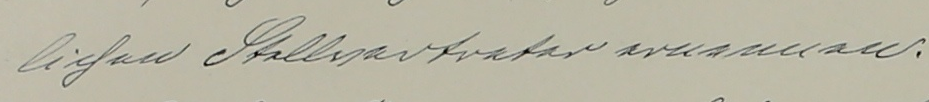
lichen Stellvertreter ernennen.
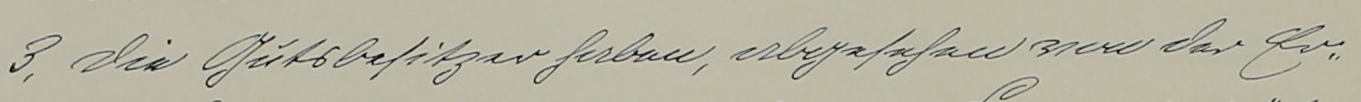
3. Die Gutsbesitzer haben, abgesehen von der Er-
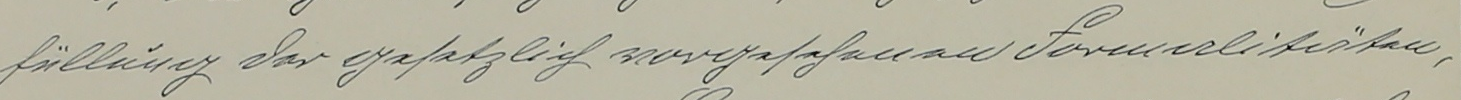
füllung der gesetzlich vorgesehenen Formalitäten,
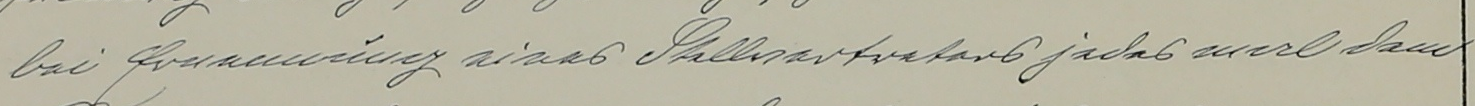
bei Ernennung eines Stellvertreters jedes mal dem
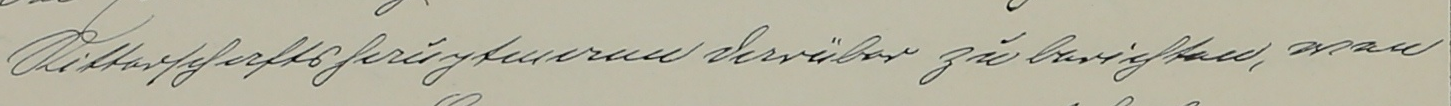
Ritterschaftshauptmann darüber zu berichten, wen
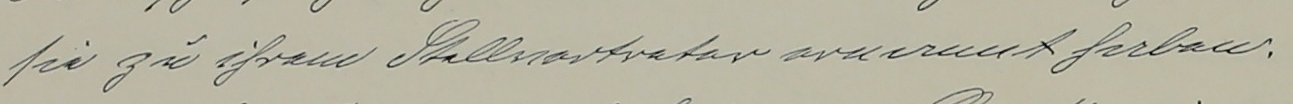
sie zu ihrem Stellvertreter ernannt haben.
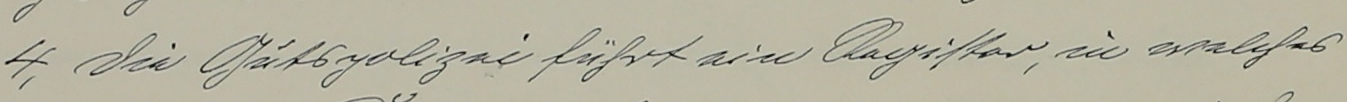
4. Die Gutspolizei führt ein Register, in welches
